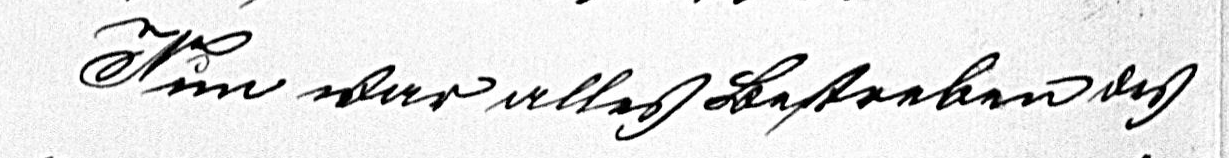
Nun war alles Bestreben des
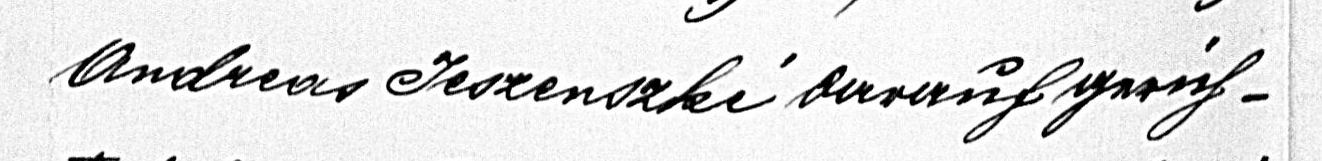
Andreas Jeszenszki darauf gerich¬
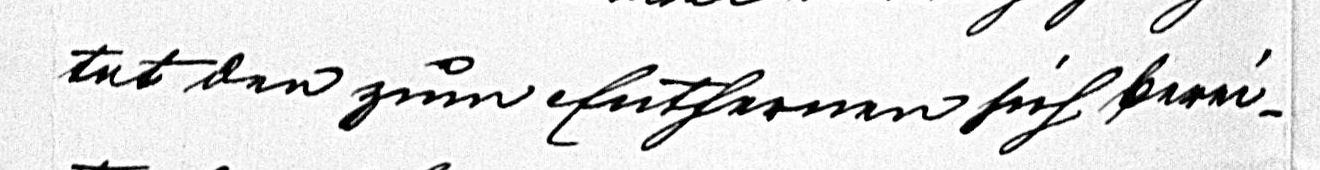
tet den zum Enfernen sich berei¬
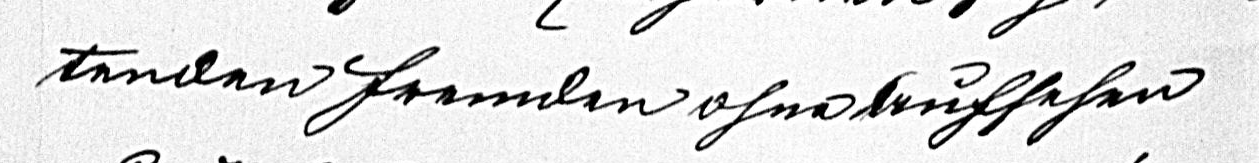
tenden Fremden ohne Aufsehen
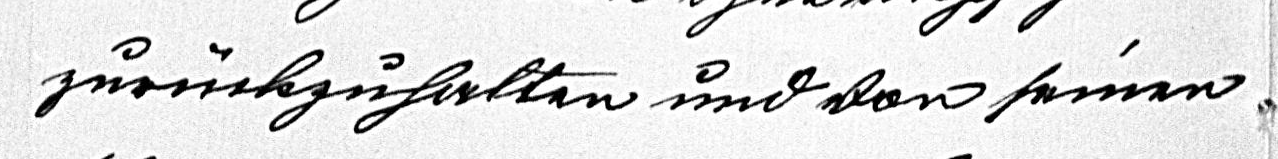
zurückzuhalten und von seinen
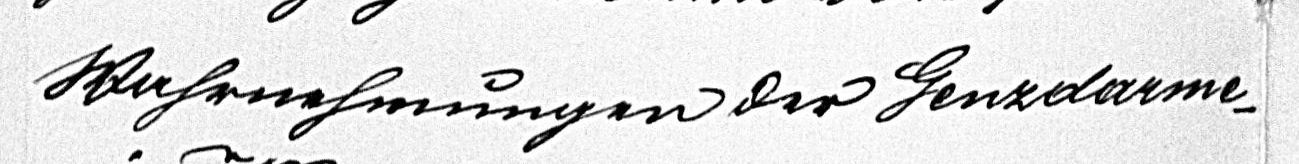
Wahrnehmungen der Genzdarme¬
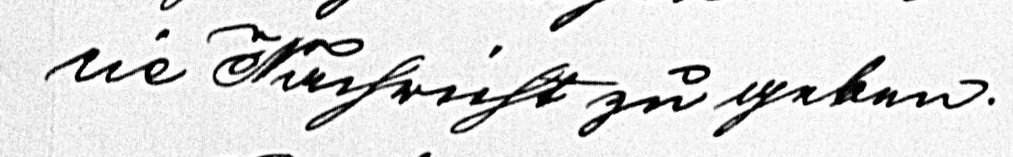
rie Nachricht zu geben.
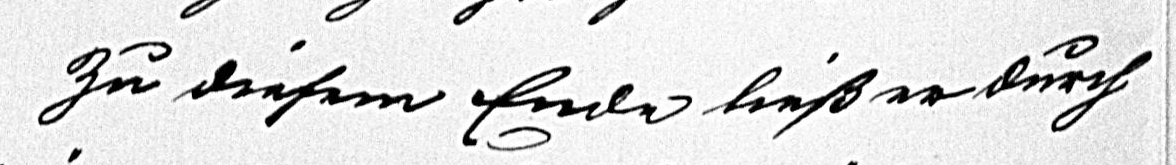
Zu diesem Ende ließ er durch
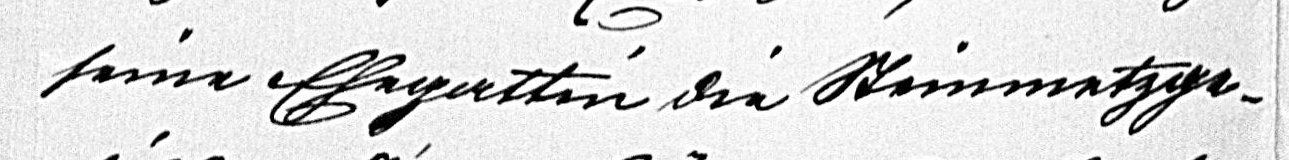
seine Ehegattin die Steinmetzge¬
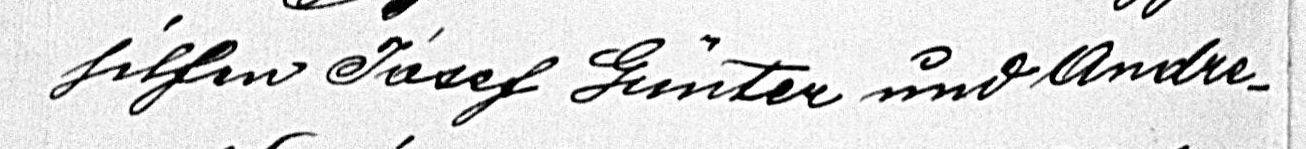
hilfen Jósef Günter und Andre¬
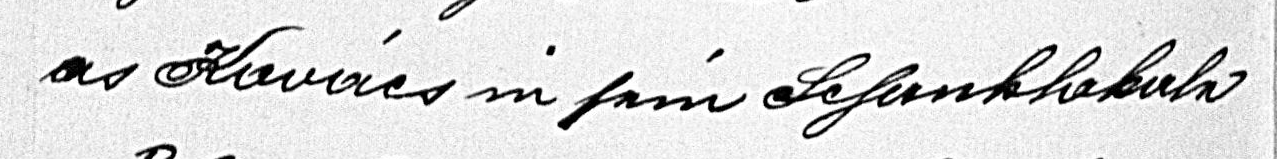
as Kovács in sein Schanklokale
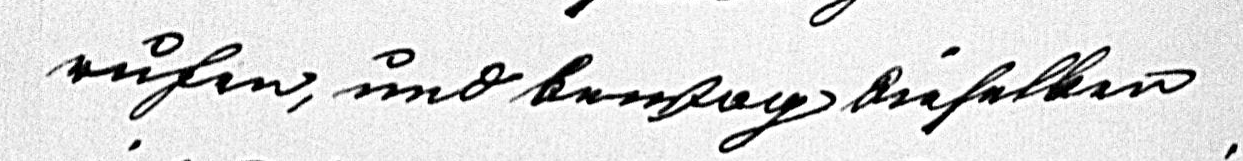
rufen, und bewog dieselben
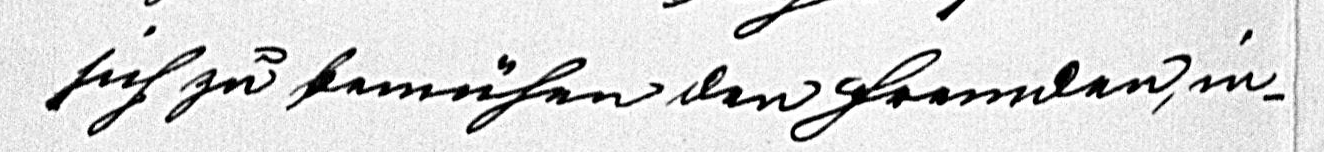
sich zu bemühen den Fremden, in¬
